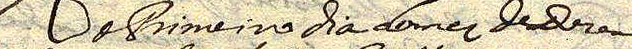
Ao Primeiro dia do mez de Dezem
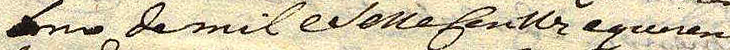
bro de mil e setteCenttoz e quaren
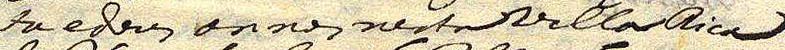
ta e dous annos nesta villa Rica
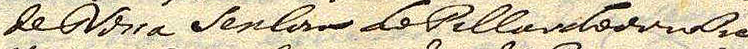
de Nossa Senhora do Pellar do ouro Pre
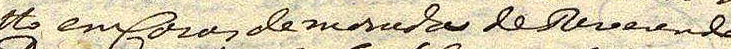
tto em Cazas de morada de Reverendo
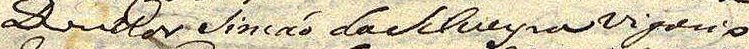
Doutor Simaõ da Silueyra vigario
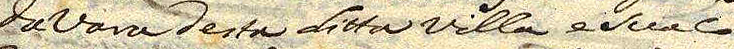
da vara desta ditta villa e sua co
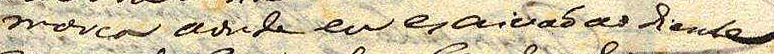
marca aonde eu escrivaõ aodiante
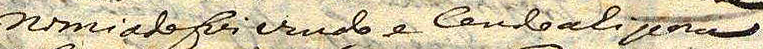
nomiado foi vindo e cendo ahi pera
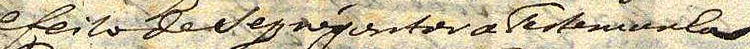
efeito de sepreguntar a Testemunha
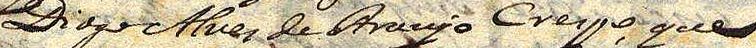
Diogo Alves de Araujo Crespo, que
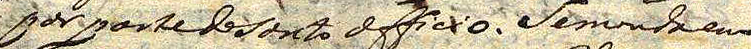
por parte do santo officio. Semanda em
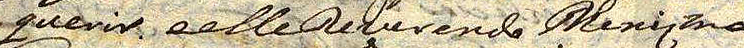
querir. e elle Reverendo Menistro
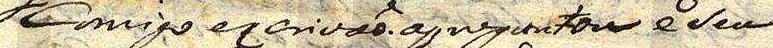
Comigo escrivaõ a proguntou e seu
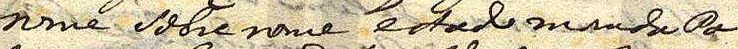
nome sobrenome estado morada Pa
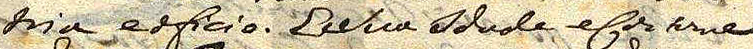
tria e oficio. E sua Idade e Costume
